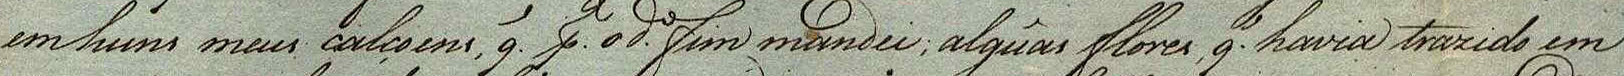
em huns meus calçoens, q̄ p.a o d.o fim mandei; algūas flores, q̄ havia trazido em
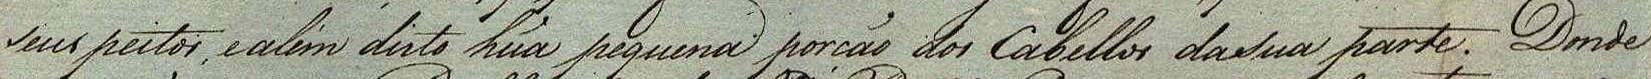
seus peitos, e alem disto hua pequena porção dos Cabellos da sua parte. Donde
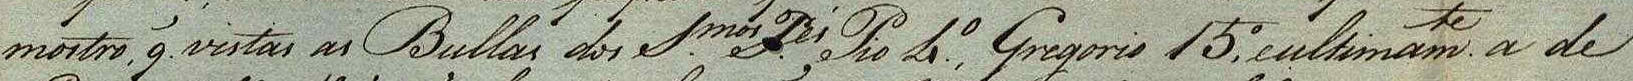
mostro, q̄ vistas as Bullas dos S.mos P.es, Pio 4.º, Gregorio 15.º e ultimam.te a de
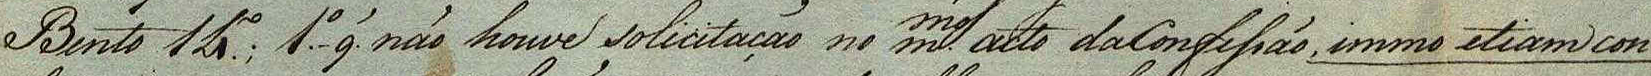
Bento 14.º; 1.º- q̄ não houve solicitaçaõ no m.mo acto da Confissaõ, immo etiam con
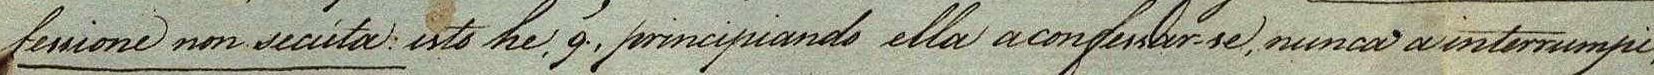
fessione non secuta: isto he q̄, principiando ella a confessar-se, nunca a interrumpi,
